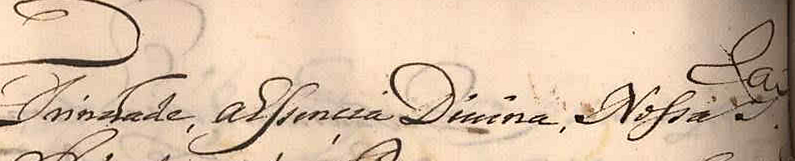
Trindade, a Essencia Diuina, Nossa Sra
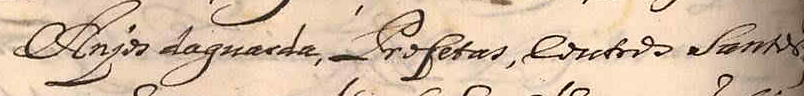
Anjos da guarda, Profetas, e outros Santos
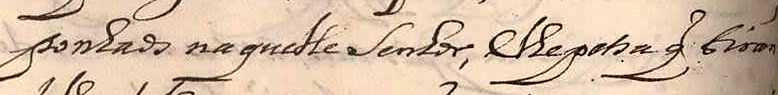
ponhaos naquelle Senhor, e lhe pessa q̄ tiran
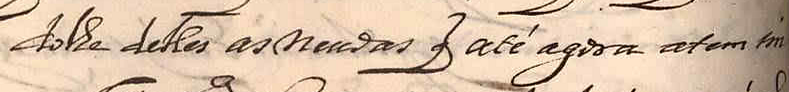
dolhe delles as neuoas q̄ até agora a tem im
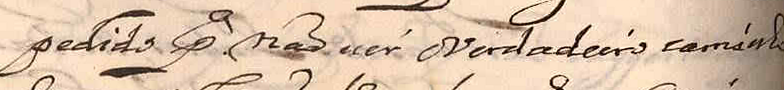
pedido p.a naõ uer o verdadeiro caminho
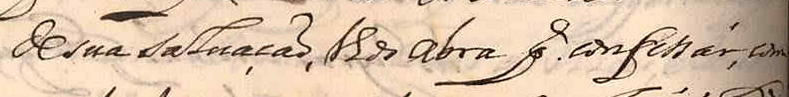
de sua saluaçaõ, lhos abra p.a confessar, com
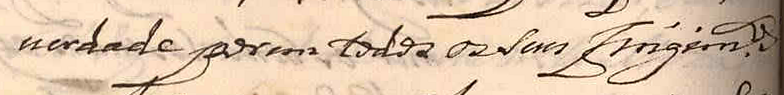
uerdade porem todos os seus fingim.tos
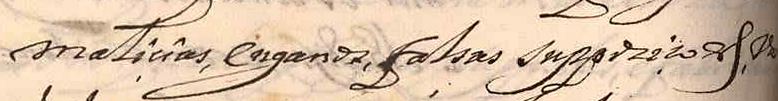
malicias, enganos, falsas suppoziçoẽs, v
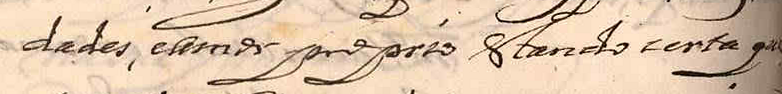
dades, e amor proprio estando certa que
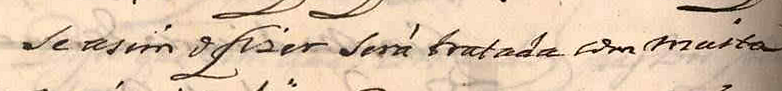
se asim o fizer será tratada com muita
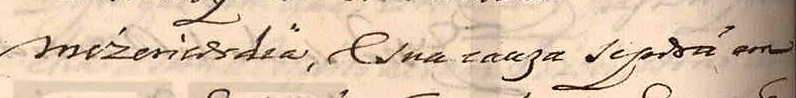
mizericordia, e sua cauza se porá em
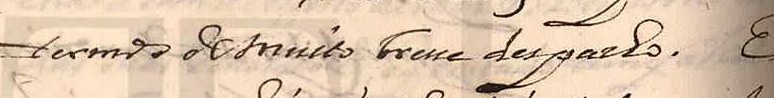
termos de muito breue despacho. E
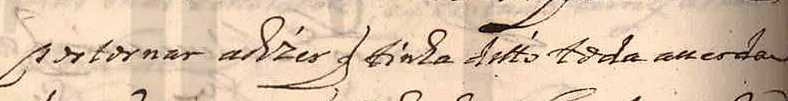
por tornar a dizer q̄ tinha ditto toda a uerda
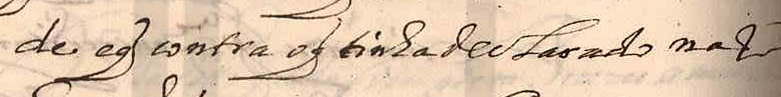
de e q̄ contra o q̄ tinha declarado naõ
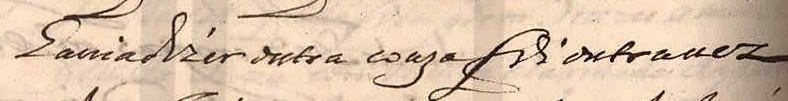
hauia dizer outra couza foi outra uez
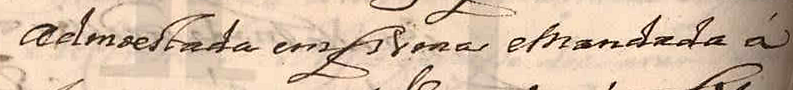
admoestada em forma e mandada a
